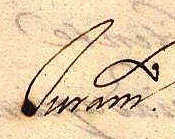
Iuram.to
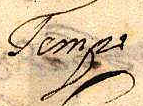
Tempo
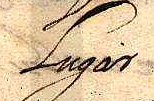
Lugar
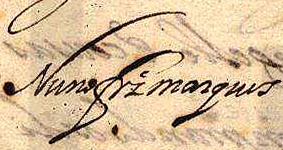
Nuno frz̄ marques
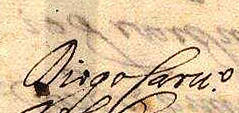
Diogo Caru.o
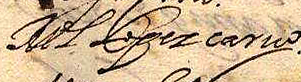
Mel Lopez caruo.
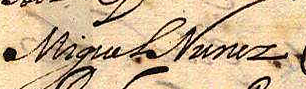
Miguel Nunez
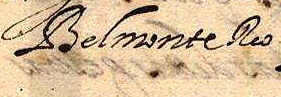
Belmonte Reo
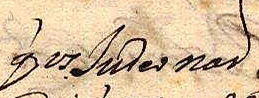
q̄ os Iudeo naõ
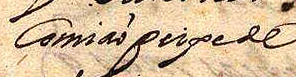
Comião peixe de
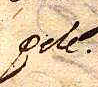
pele.
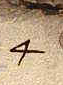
4
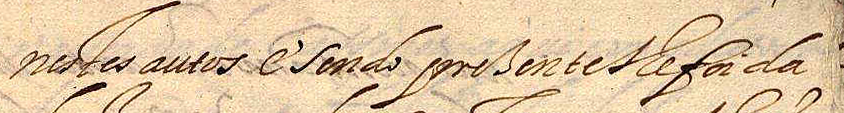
nestes autos e sendo prezente lhe foi da
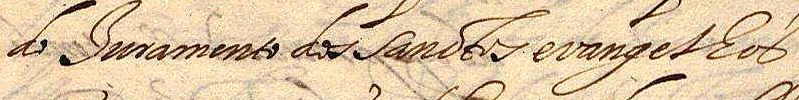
do Iuramento dos sanctos evangelhos
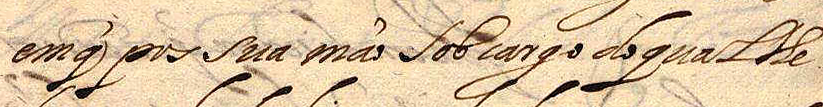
em q̄ pos sua mão sob cargo do qual lhe
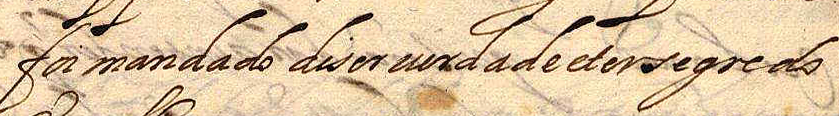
foi mandado diser uerdade e ter segredo
